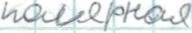полярная
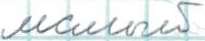малый
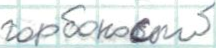горбоносый
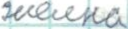желна
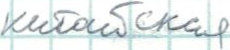китайская
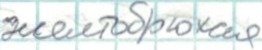желтобрюхая
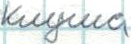клуша
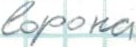ворона
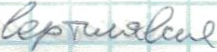вертлявая
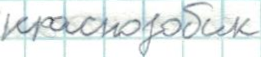краснозобик
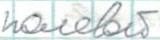полевой
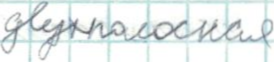двухполосная
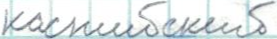каспийский
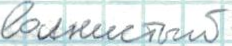волнистый
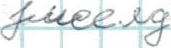змееяд
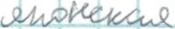японская
